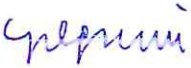средний
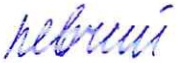певчий
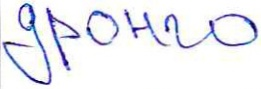дронго
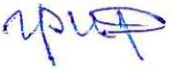гриф
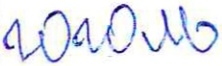гоголь
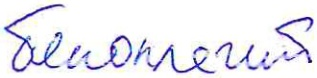белоплечий
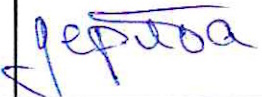деряба
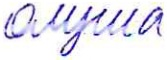олуша
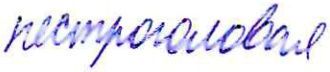пестроголовая
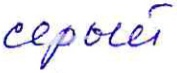серый
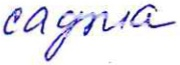саджа
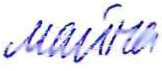майна
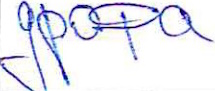дрофа
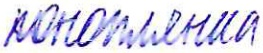коноплянка
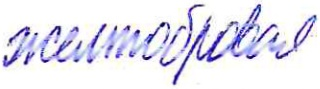желтобровая
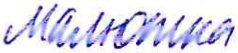малютка
